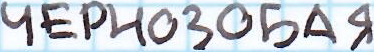чернозобая
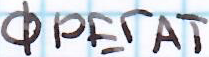фрегат
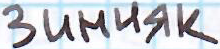зимняк
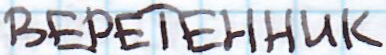веретенник
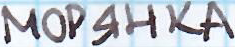морянка
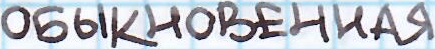обыкновенная
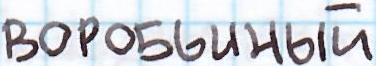воробьиный
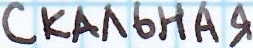скальная
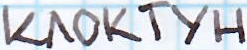клоктун
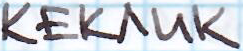кеклик
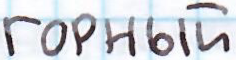горный
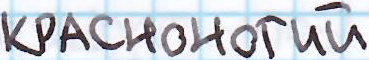красноногий
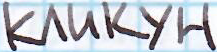кликун
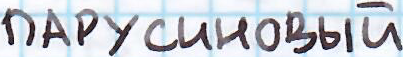парусиновый
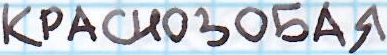краснозобая
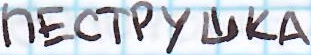пеструшка
